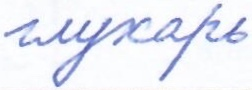глухарь
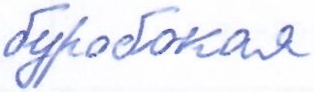буробокая
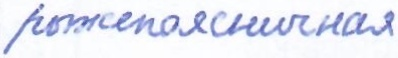рыжепоясничная
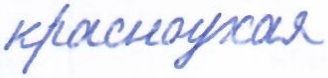красноухая
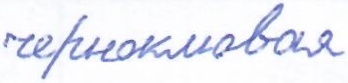черноклювая
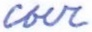сыч
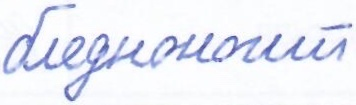бледноногий
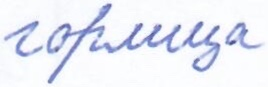горлица
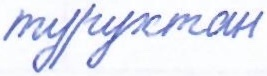турухтан
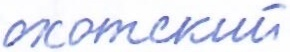охотский
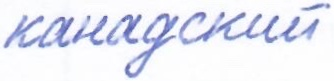канадский
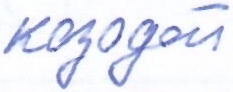козодой
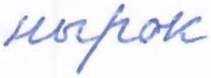нырок
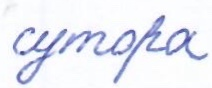сутора
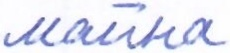майна
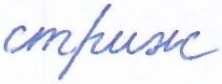стриж
